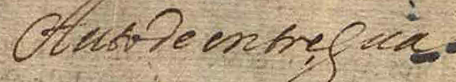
Auto de entregua
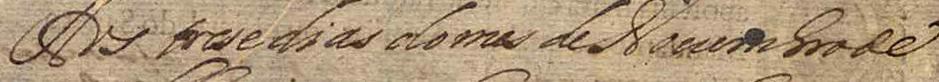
Aos trese dias do mes de Nouembro de
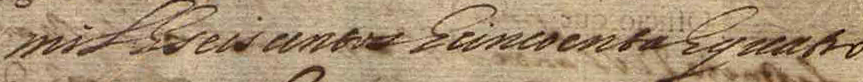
mil E seiscentos E cincoenta E quatro
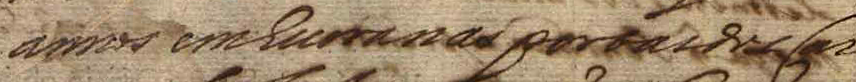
annos em Euora nas portas dos Car
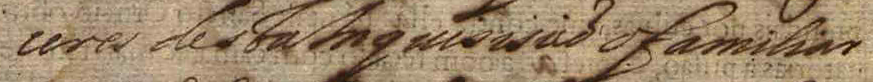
ceres desta Inquisiçaõ o familiar
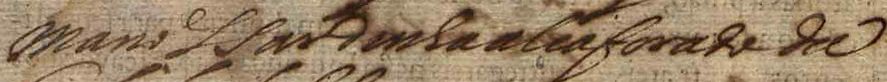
Manoel Sardinha alcaforado da
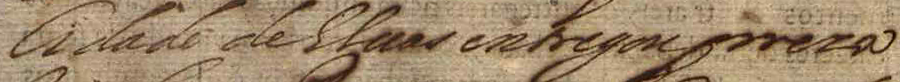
Cidade de Eluas entregou preza
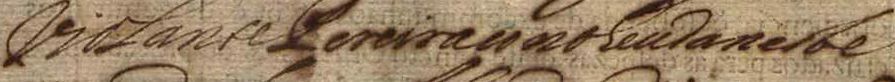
Violante Pereira contheuda neste
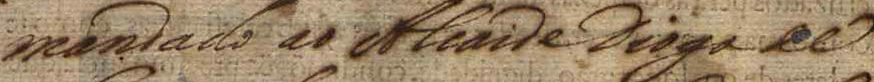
mandado ao Alcaide Diogo de
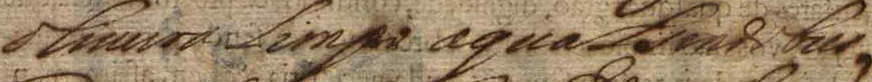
Oliueira Limpo a qual sendo bus
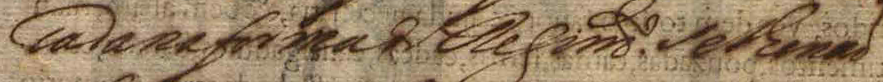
cada na forma do Regim.to, se lhe naõ
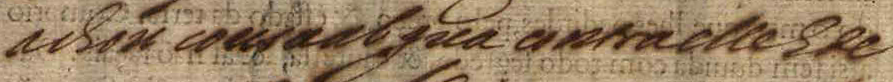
achou cousa algua contra elle E de
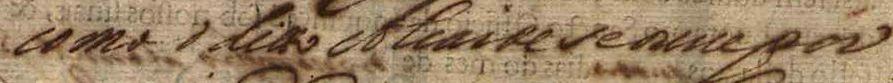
como o ditto Alcaide se ouue por
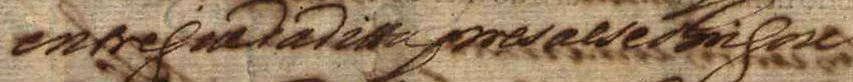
entregue da ditta presa e se obrigou
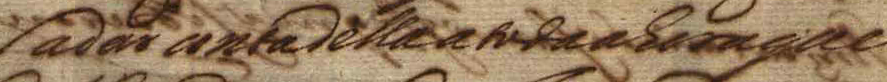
a dar conta della a toda a hora que
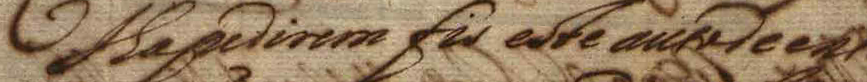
lha pedirem fis este auto de entre
